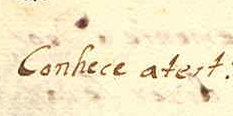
Conhece a test.a
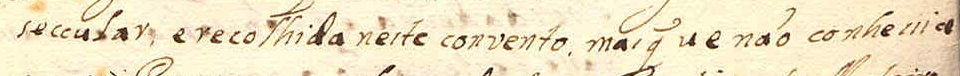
seccular e recolhida neste convento, mas q̄ue naõ conheciaõ
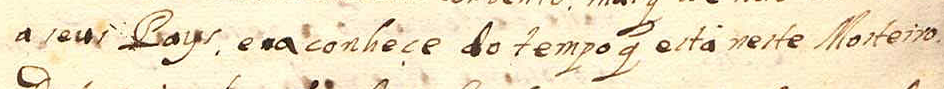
a seus Pays, e _a conhece do tempo q̄ esta neste Mosteiro.
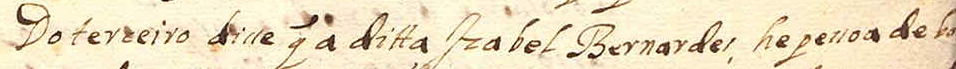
Do terceiro disse q̄ a ditta Jzabel Bernardes, he pessoa de bo
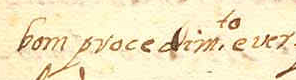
bom procedim.to e ver
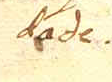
dade.
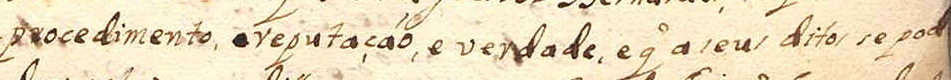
procedimento, e _reputaçaõ, e verdade, e q̄ a seus ditos se pod
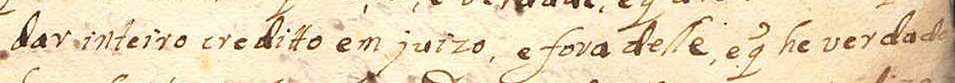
dar inteiro creditto em juizo, e fora delle, e q̄ he verdade
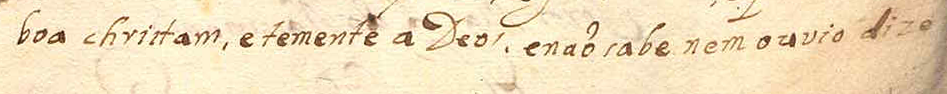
boa christam, e temente a Deos. e naõ sabe nem ouvio dize
